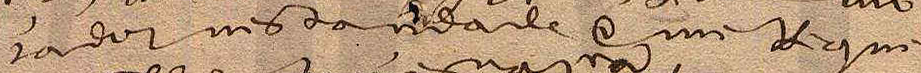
rador nesta çidade e me Reque
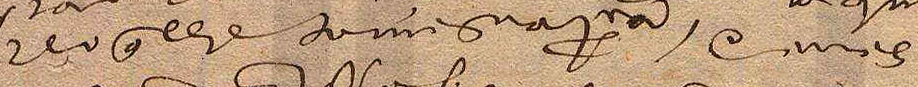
reo q̄ lhe tome sua ꝓcā / e eu es
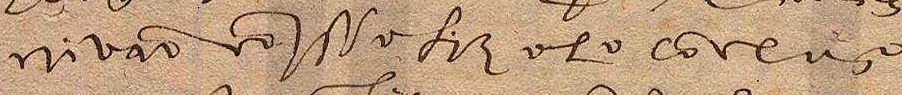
crivaõ cō Jsso fiz o Lo cōcluso
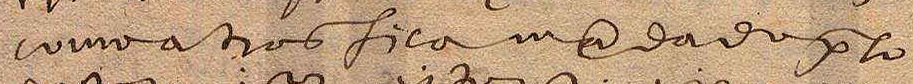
como atras fica mādado p̄lo
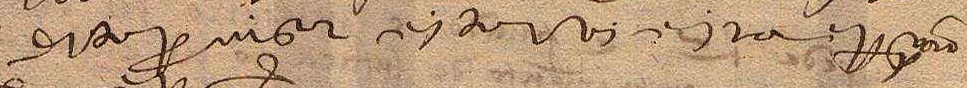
dito ꝓuisor ejtor vjejra estp̄vaõ
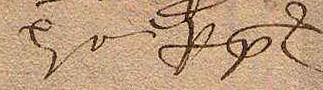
ho estp̄j
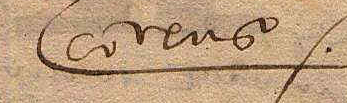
Cōcluso /.
